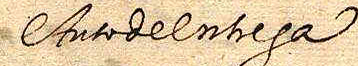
Auto de entrega
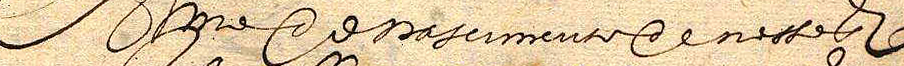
Anno do nascimento de nosso sor
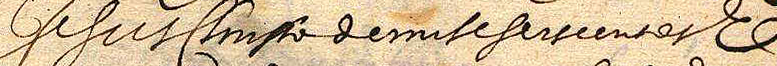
Jesus Christo de mil e seiscentos E
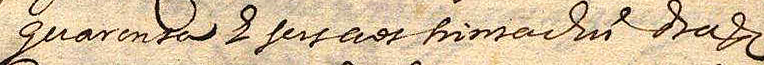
quarenta E seis aos trinta e hū dias
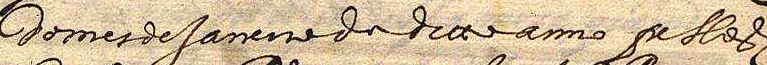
do mes de Janeiro do ditto anno pellos
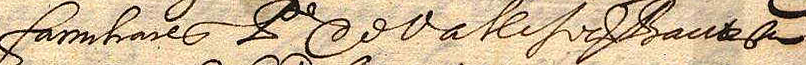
familiares Po do valle Joaõ Bautista
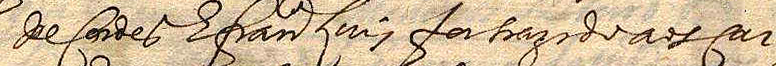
de Cordes E Franco Luis foi trazido aos Car
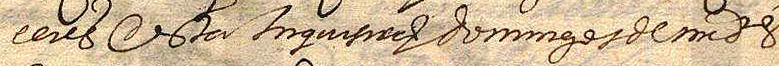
ceres desta Inquisicaõ domingos de medros
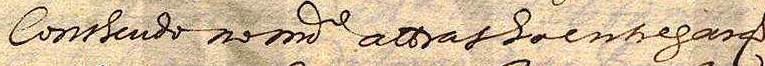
Contheudo no mdo attras E o entregaraõ
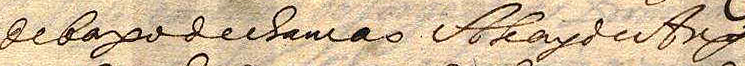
debaxo de chaue ao Alcayde Augo
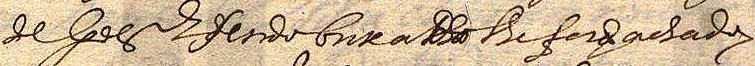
de Goes E sendo busca_ lhe foraõ achados
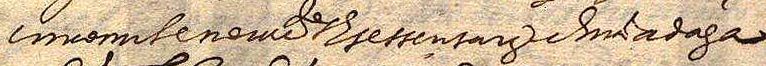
cinco mil e nouectos E sessenta rs̄ e huā adaga
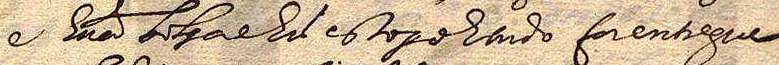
e huā bolsa e hū estojo E tudo foi entregue
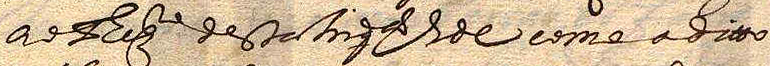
ao Thezro desta Inqaõ E de como o ditto
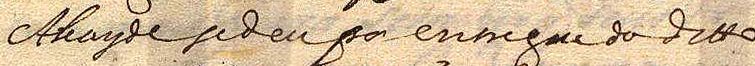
Alcayde se deu por entregue do ditto
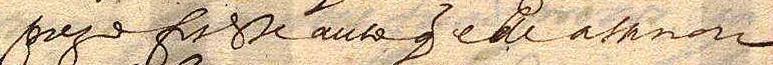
prezo foi este auto q̄ elle assinou
